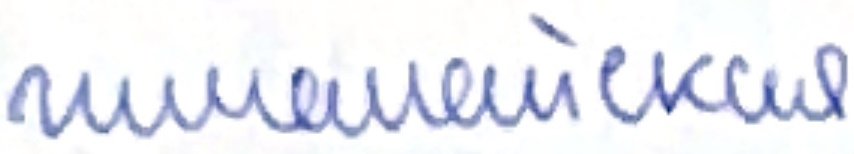гималайская
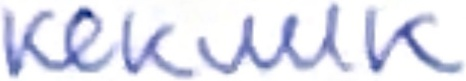кеклик
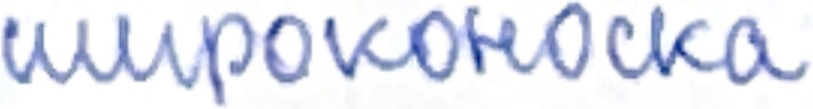широконоска
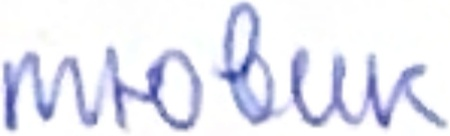тювик
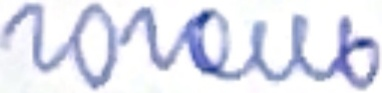гоголь
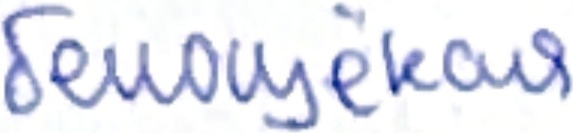белощёкая
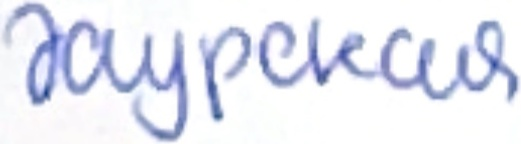даурская
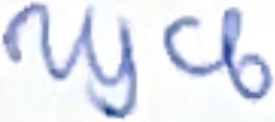гусь
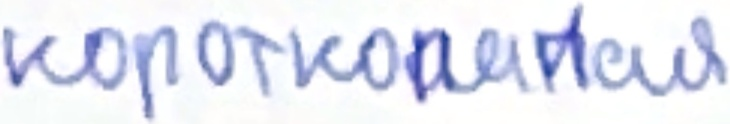короткопалая
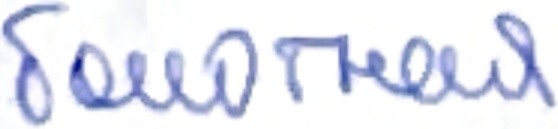боиотная
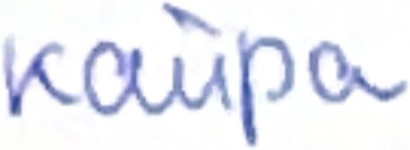кайра
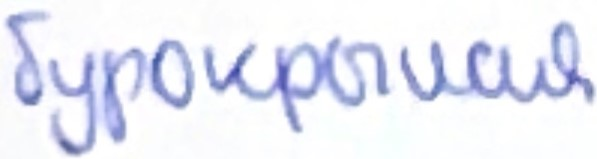бурокрылая
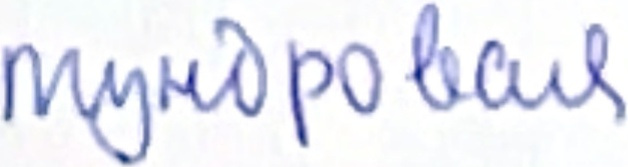тундровая
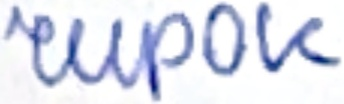чирок
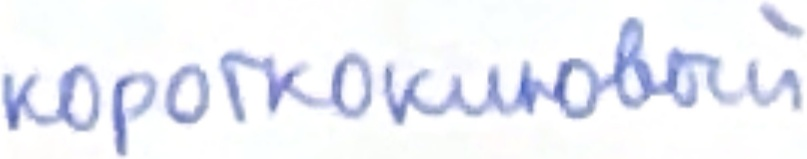короткоклювый
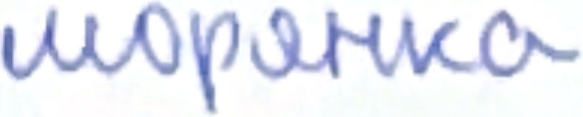морянка
